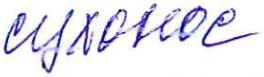сухонос
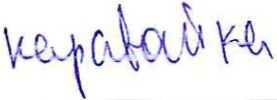каравайка
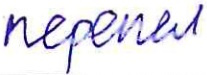перепел
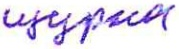щурка
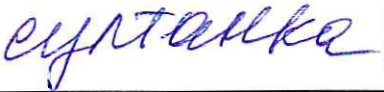султанка
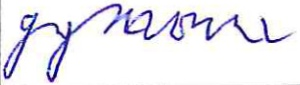дутыш
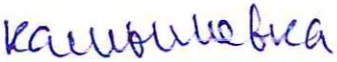камышевка
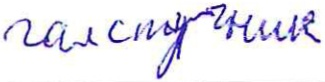галстучник
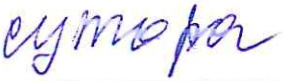сутора
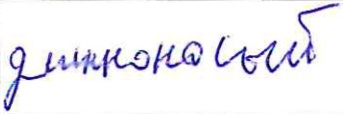длинноносый
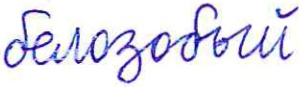белозобый
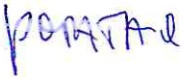рогатая
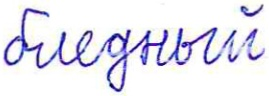бледный
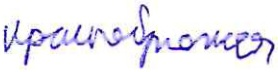краснобрюхая
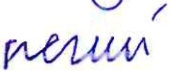пегий
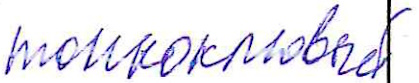тонкоклювый
